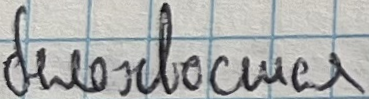белохвостая
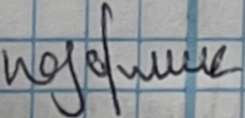подорлик
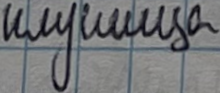клушица
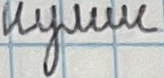кулик
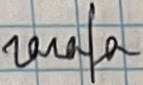гагара
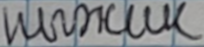пыжик
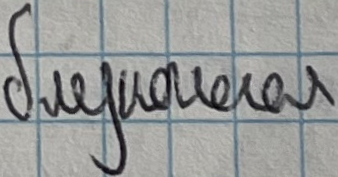бледноногая
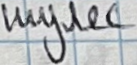тулес
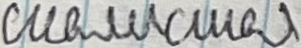скалистая
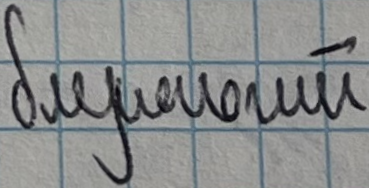бледноногий
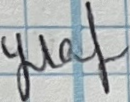улар
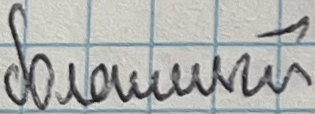болотный
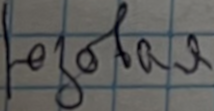розовая
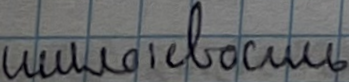шилохвость
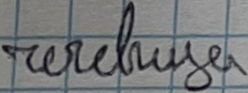чечевица
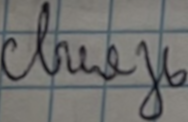свиязь
